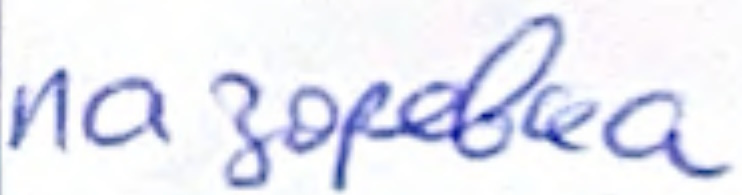ла зоревка
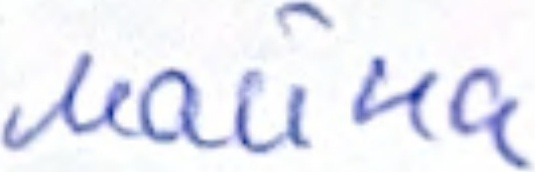майна
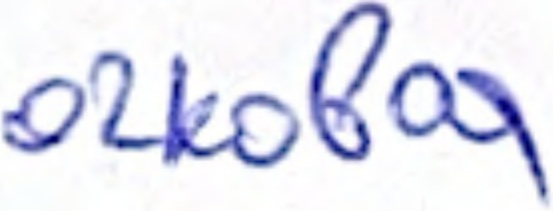очковая
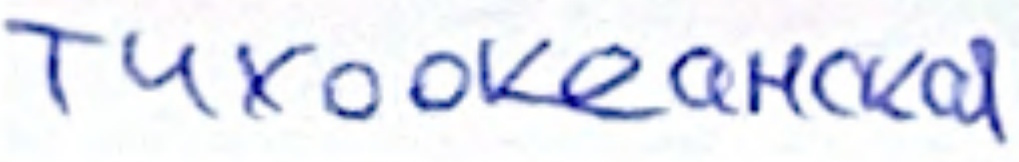тихоокеанская
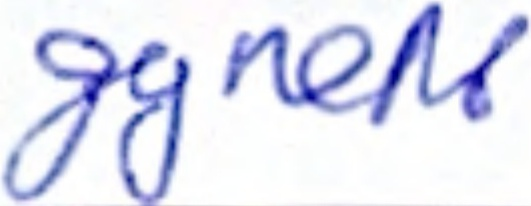дупель
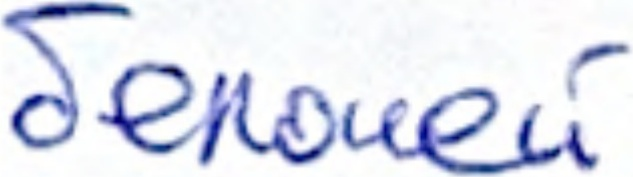белошей
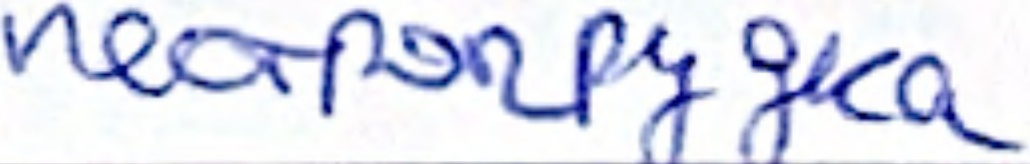пестрогрудка
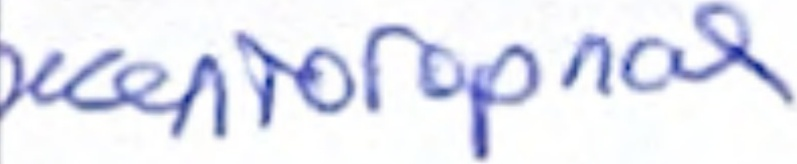желтогорлая
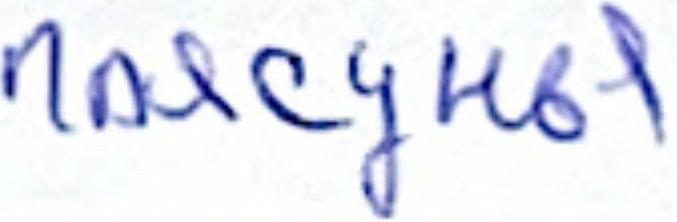плясунья
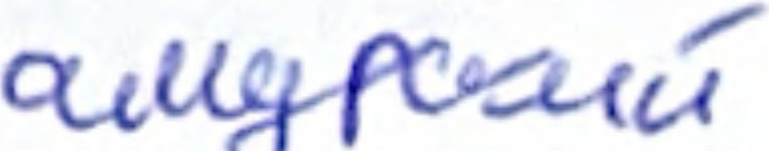амурский
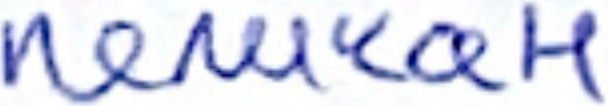пеликан
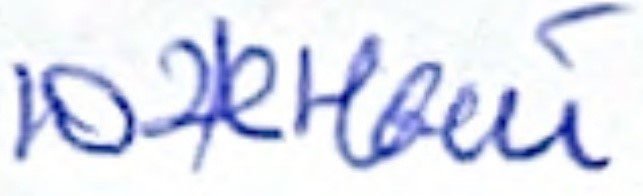южный
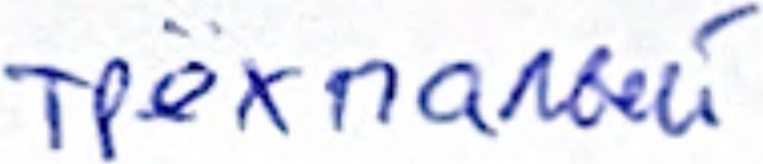трёхпалый
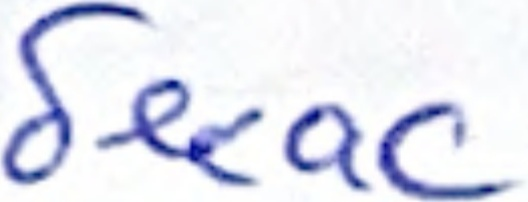бекас
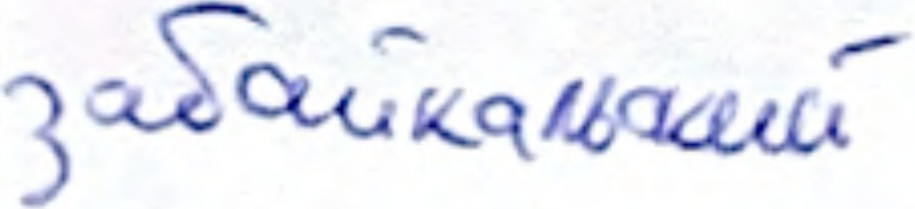забайкальский
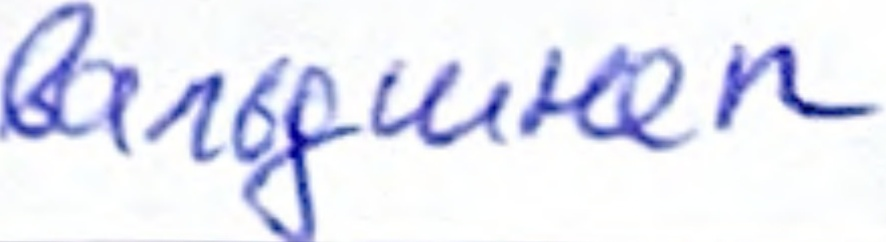вальдшнеп
